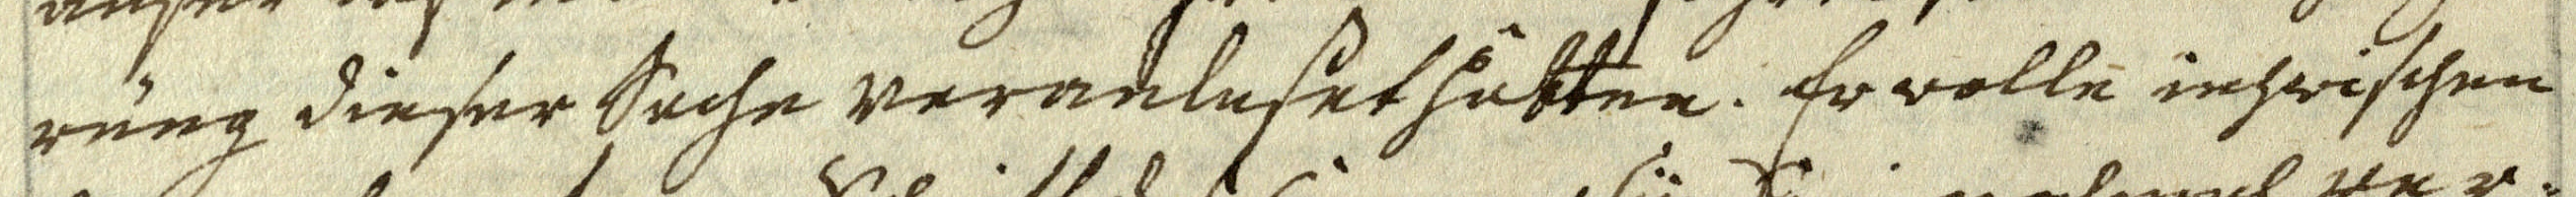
rung dieser Sache veranlaßet hätten. Er wolle inzwischen
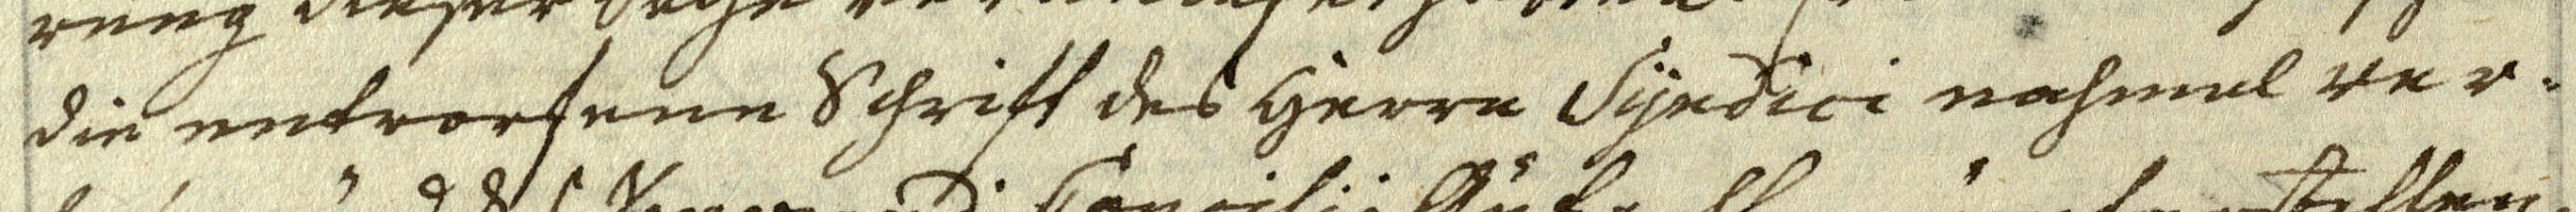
die entworfene Schrift des Herrn Sÿndici nochmal ver¬
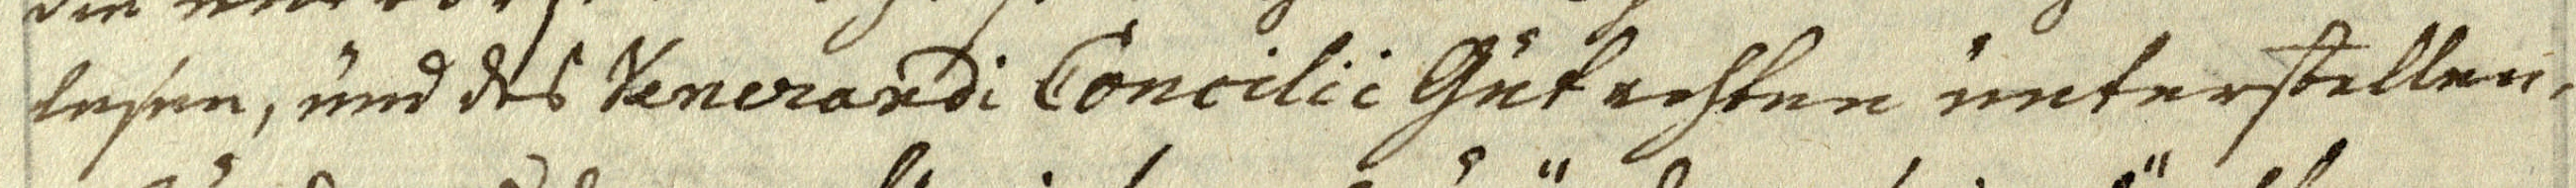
lesen, und des Venerandi Concilii Gutachten unterstellen,
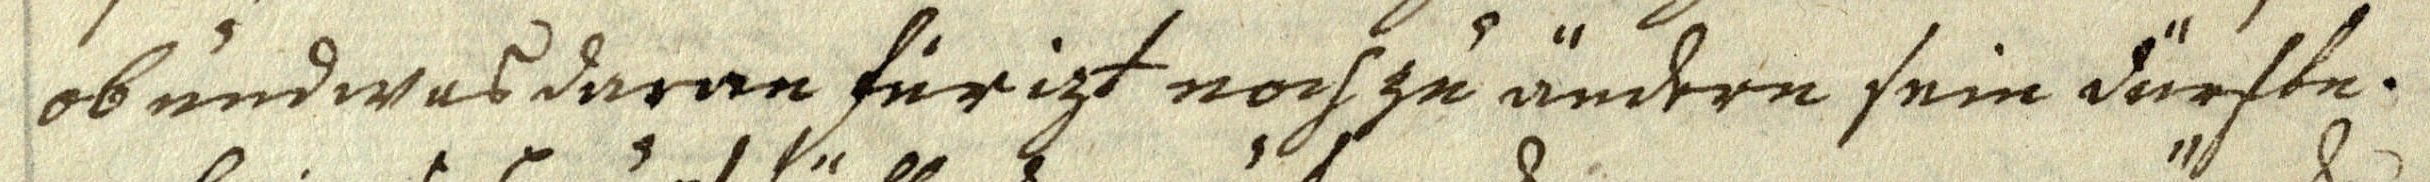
ob und was daran für izt noch zu ändern sein dürfte.
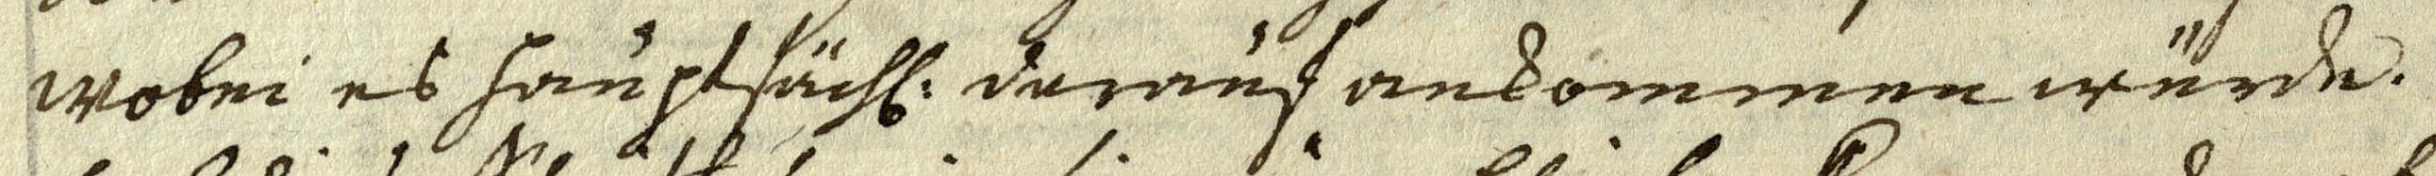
Wobei es hauptsächl. darauf ankommen würde,
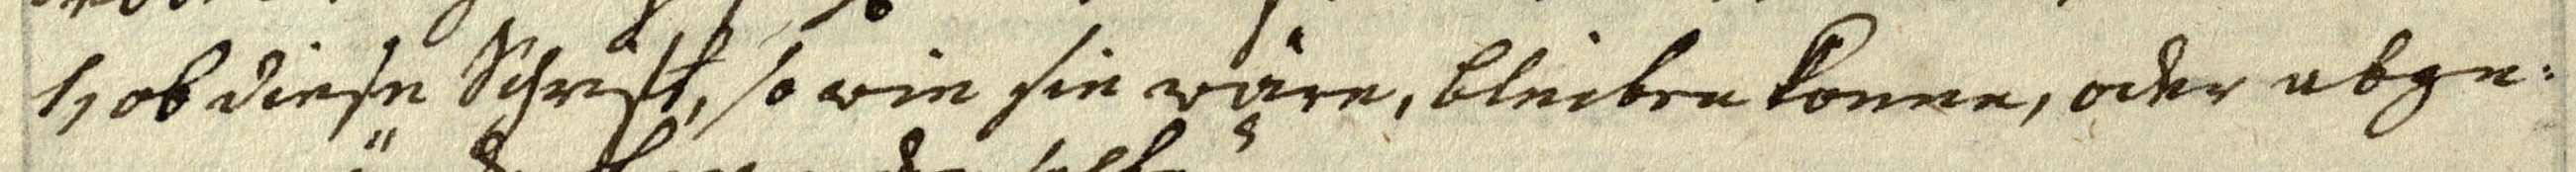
1, ob diese Schrift, so wie sie wäre, bleiben könne, oder abge¬
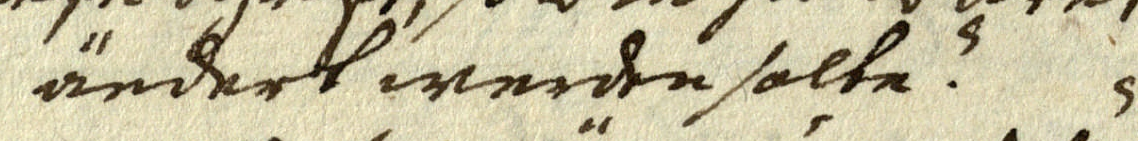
ändert werden solte?
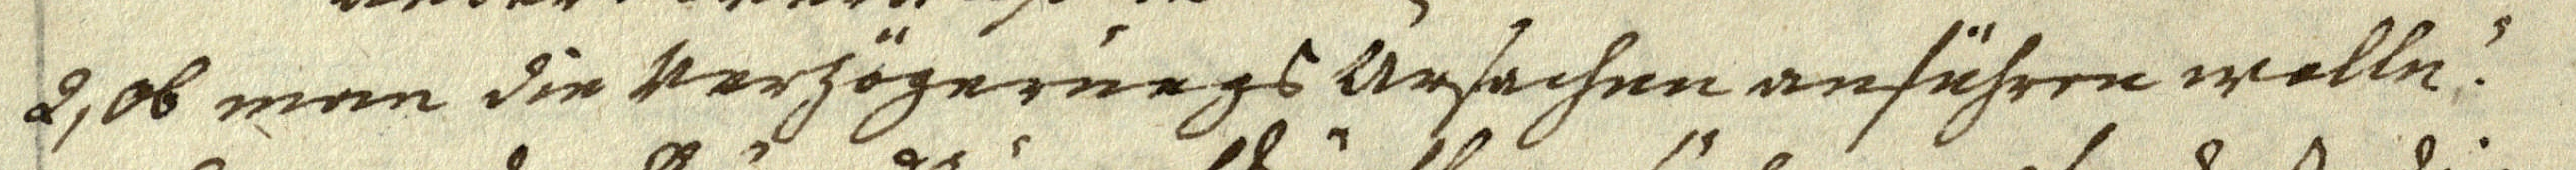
2, ob man die Verzögerungs Ursachen anführen wolle?
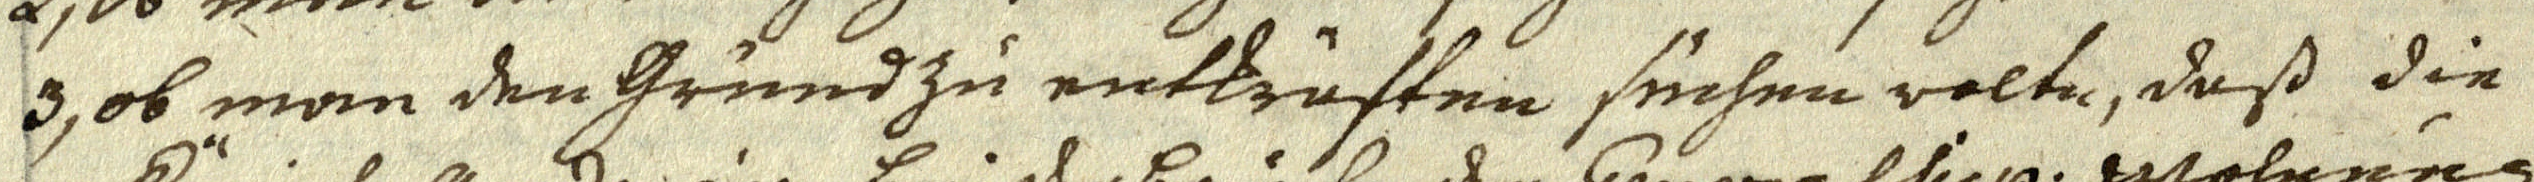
3, ob man den Grund zu entkräften suchen wolte, daß die
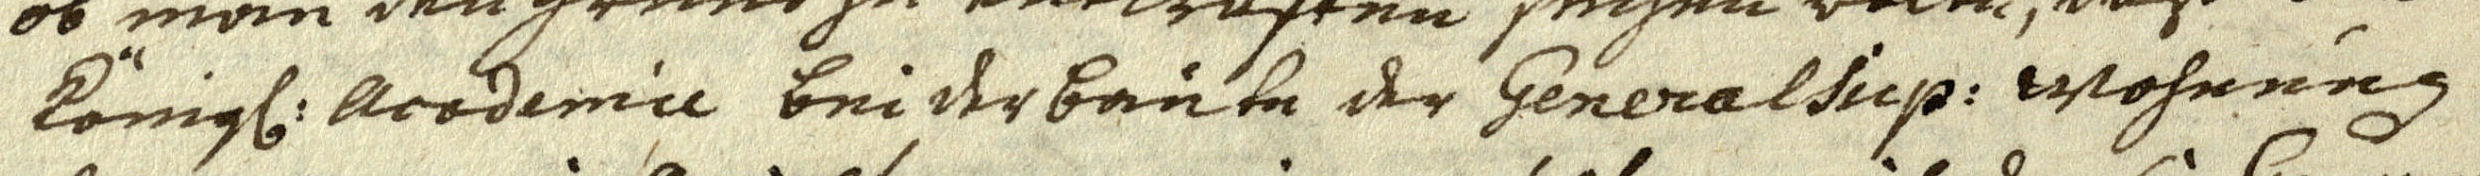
Königl. Academie bei der Baute der GeneralSup. Wohnung
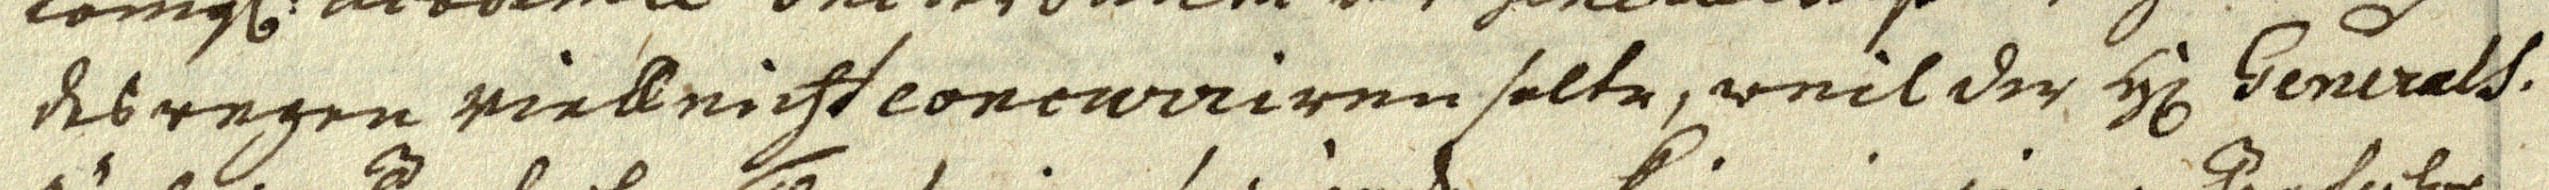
deswegen vielleicht concurriren solte, weil dh. GeneralS.
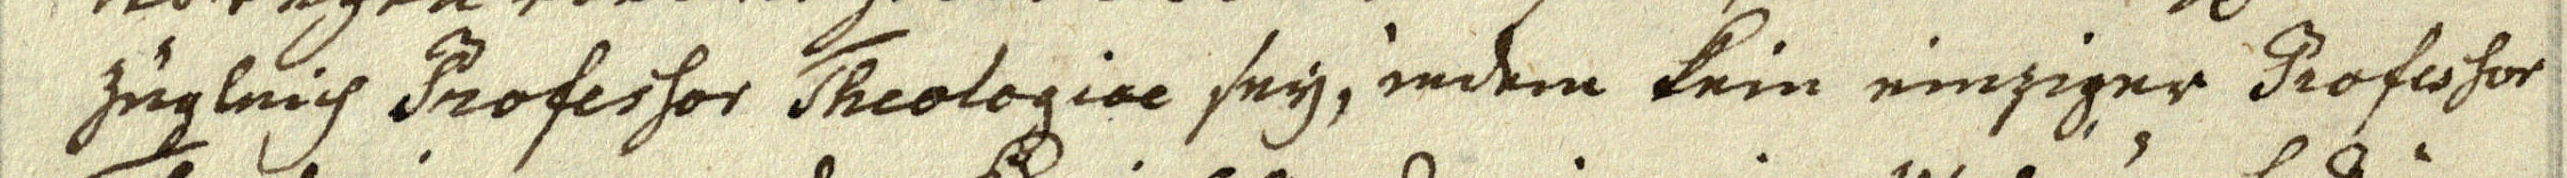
zugleich Professor Theologiae seÿ, indem kein einziger Professor
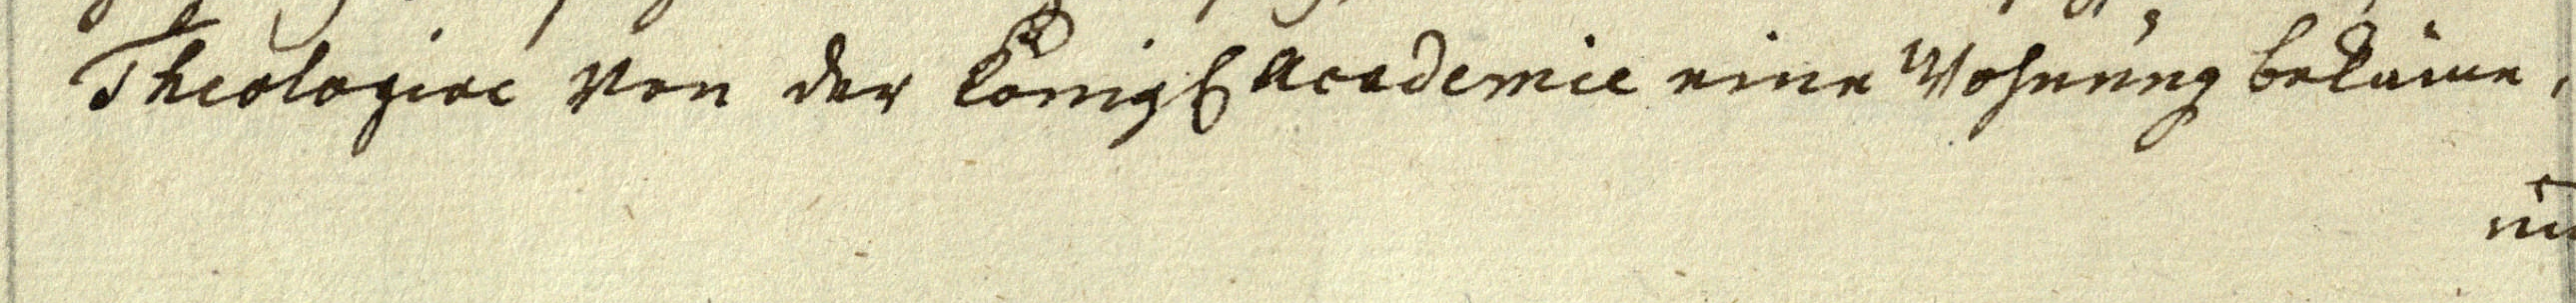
Theologiae von der Königl. Academie eine Wohnung bekäme,
